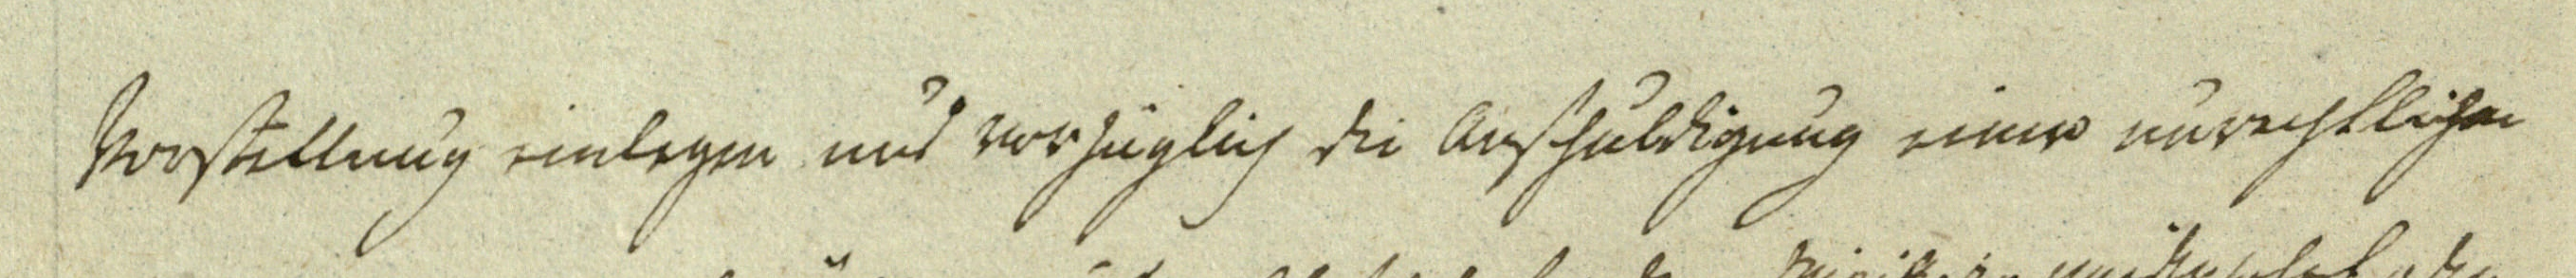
Vorstellung einlegen und vorzüglich die Anschuldigung einer unrechtlichen
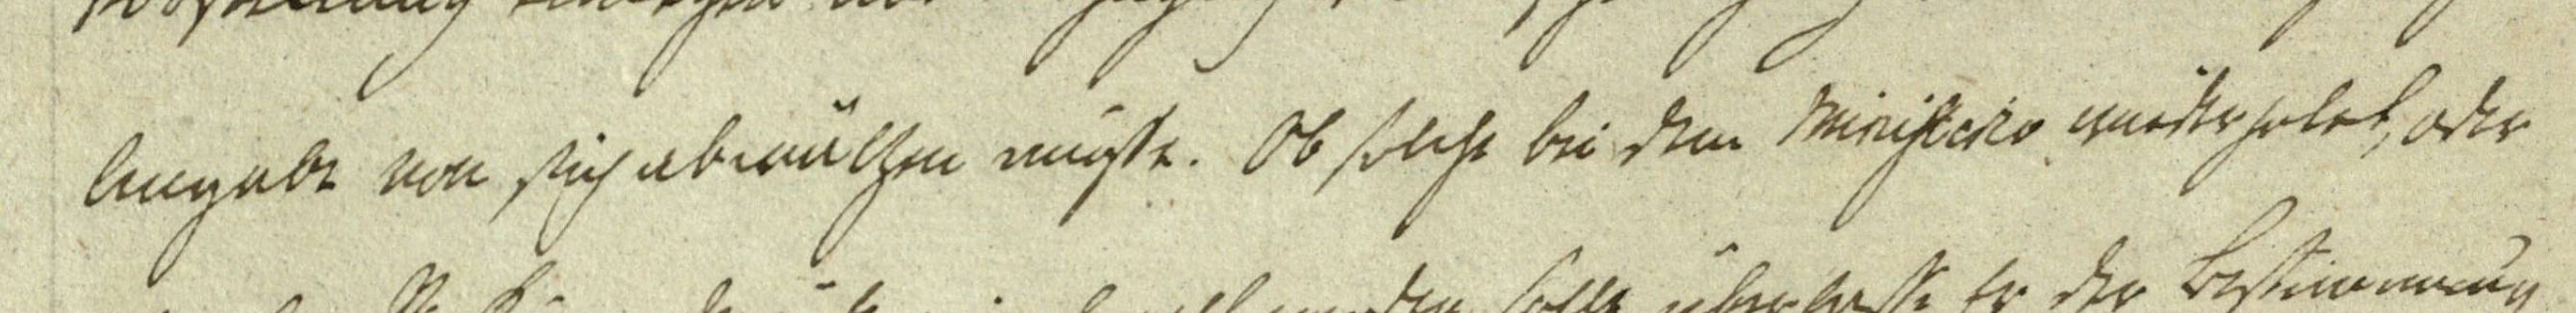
Angabe von sich abwälzen müsse. Ob solche bei dem Ministerio wiederholet, oder
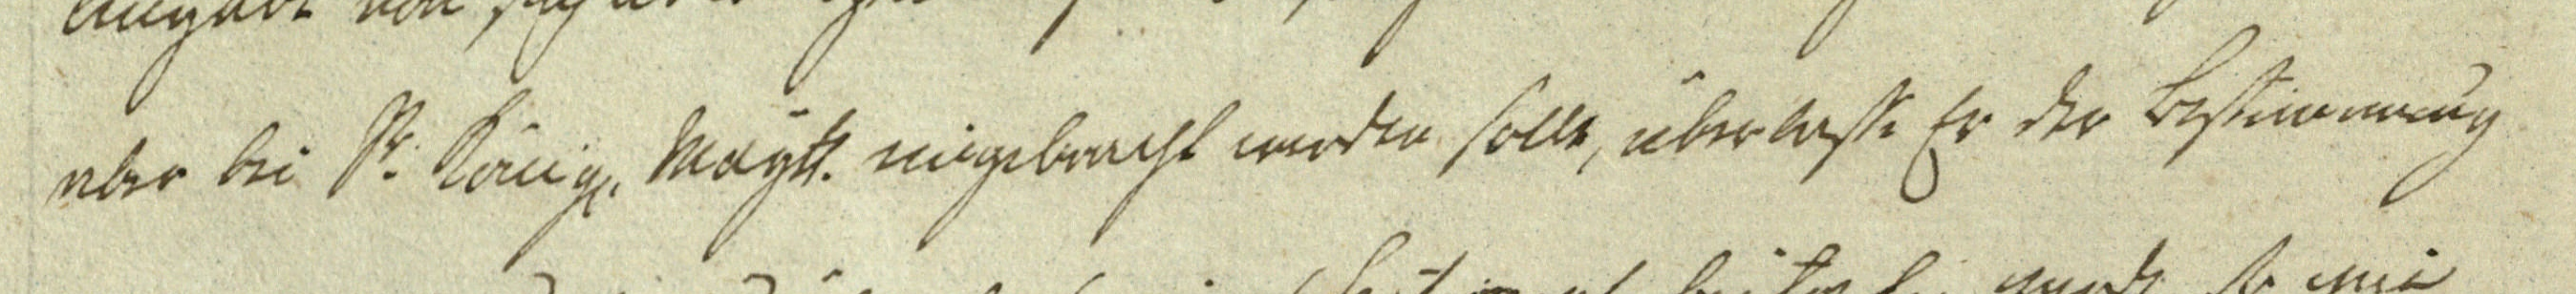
aber bei Sr. Königl. Maÿtt. eingebracht werden solle, überlasse Er der Bestimmung
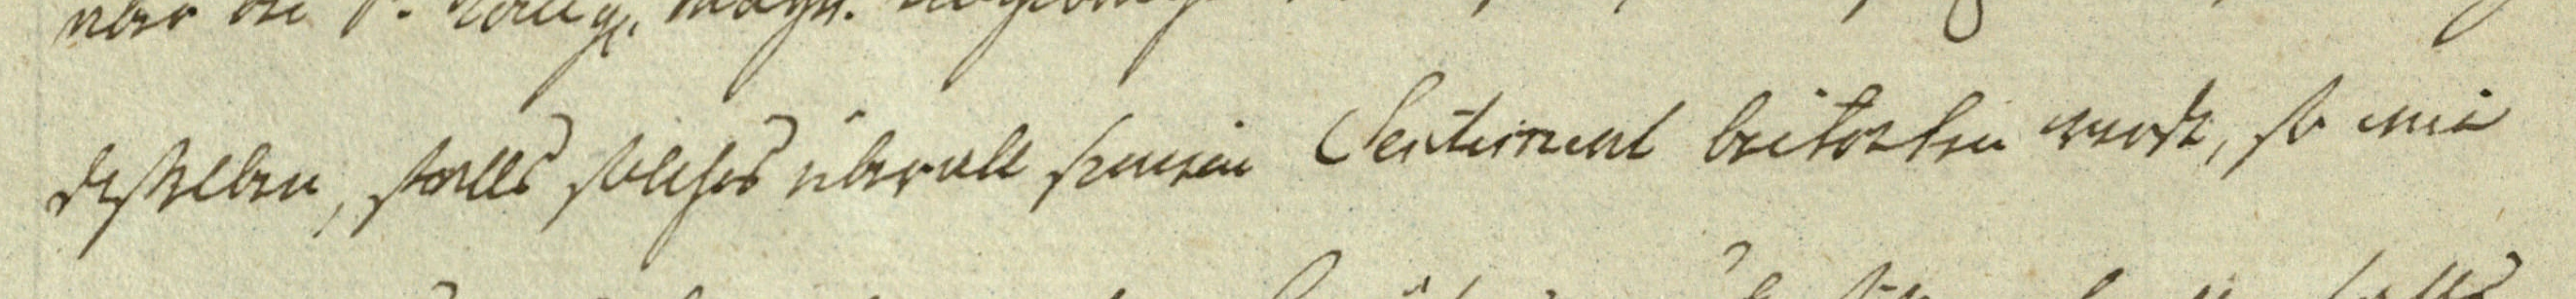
desselben, falls solches überall seinem Sentiment beitreten werde, so wie
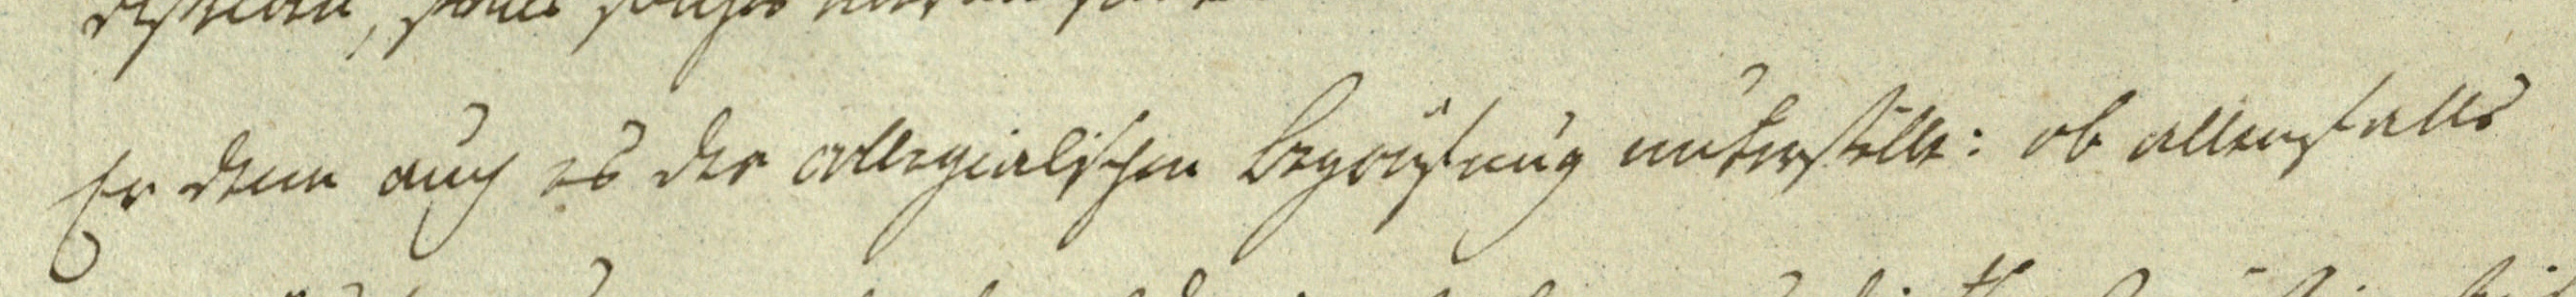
Er denn auch es der collegialischen Beprüfung unterstelle: ob allenfalls
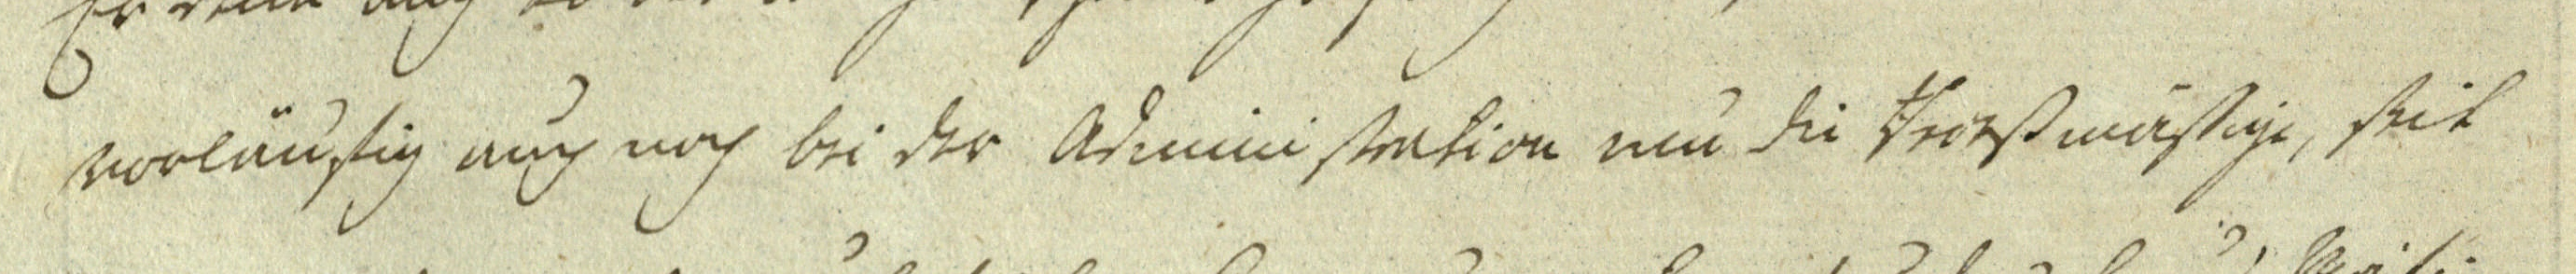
vorläufig auch noch bei der Administration um die Receßmässige, seit
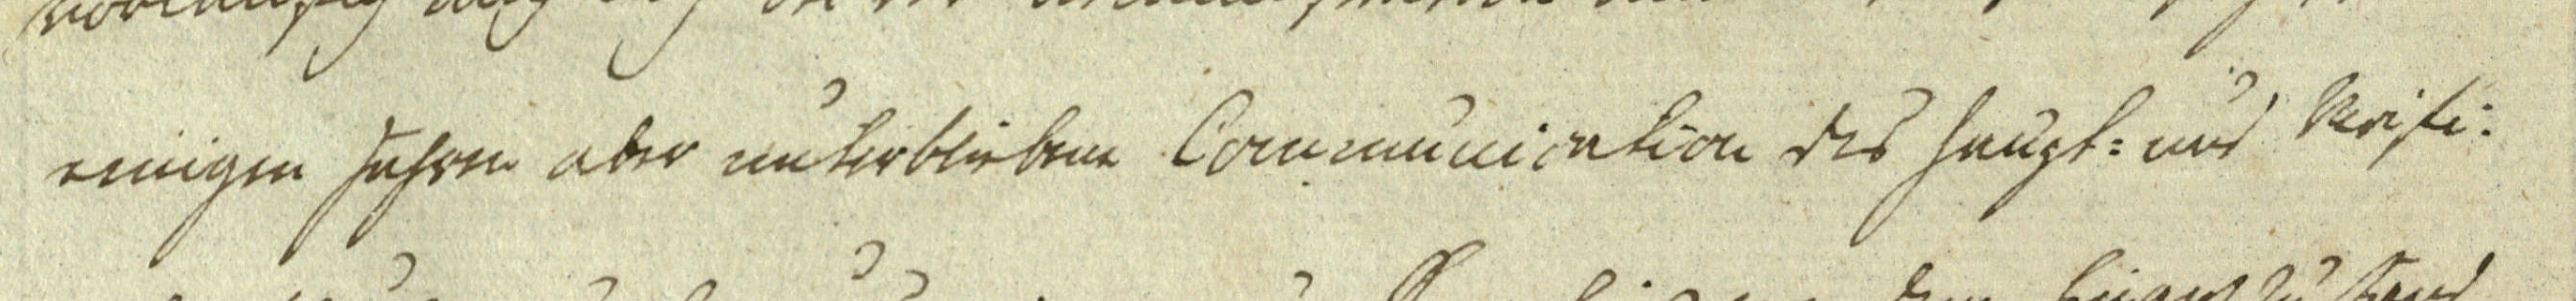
einigen Jahren aber unterbliebene Communication des Haupt- und Verifi¬
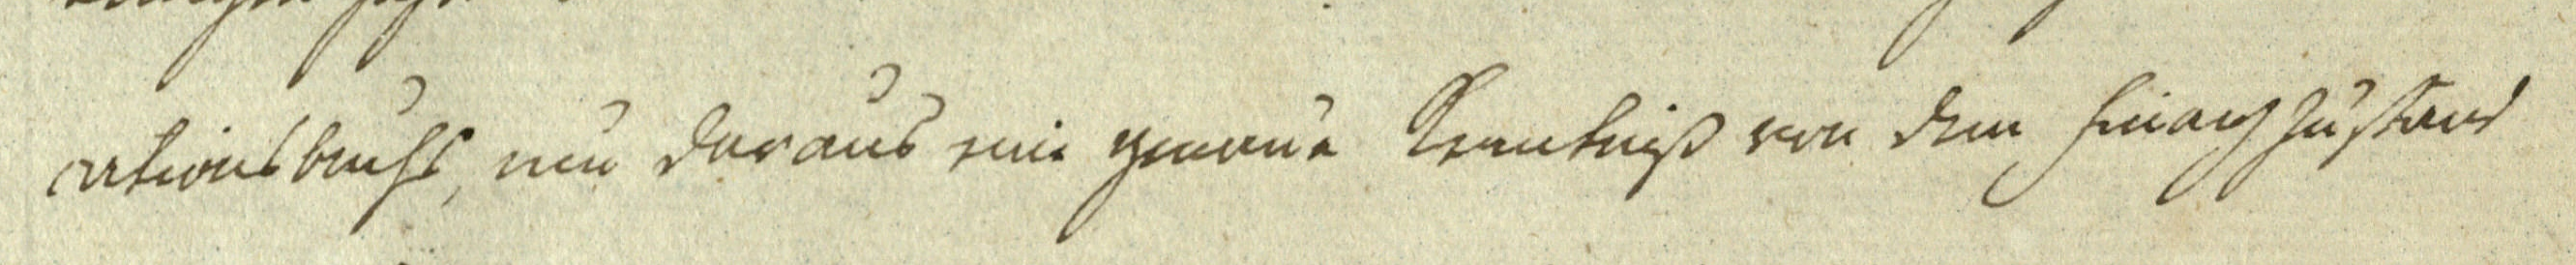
cationsbuchs, um daraus eine genaue Kenntniß von dem Finanzzustand
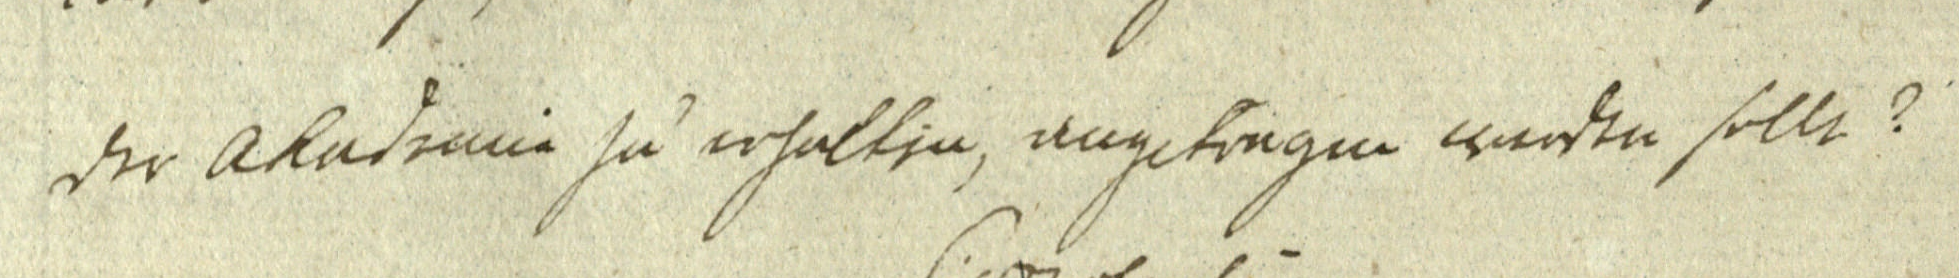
der Akademie zu erhalten, angetragen werden solle?
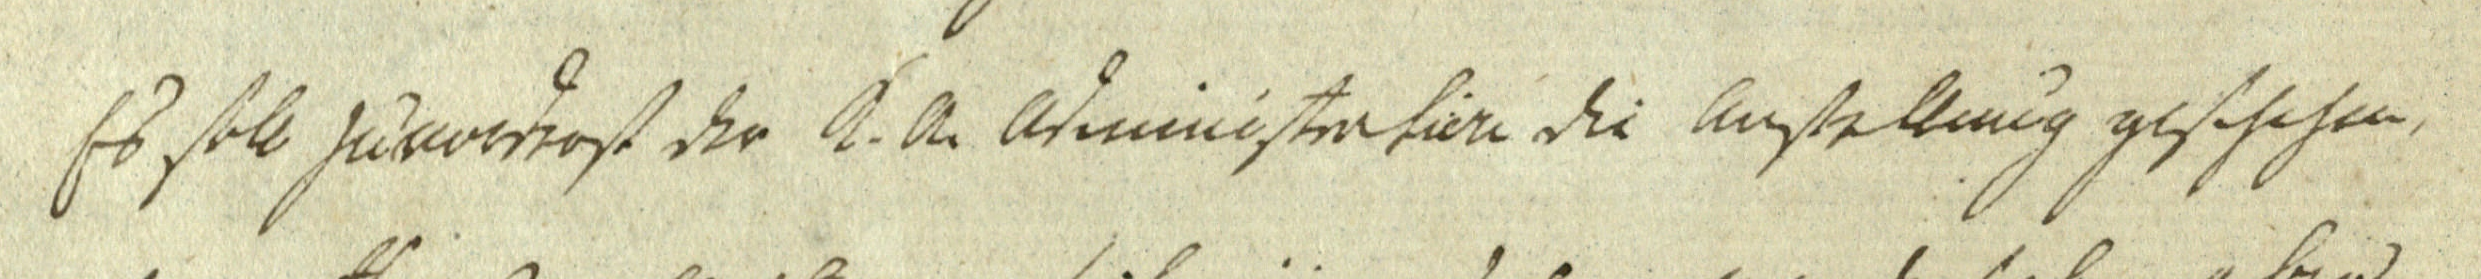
Es sol zuvorderst der K. A. Administration die Anstellung geschehen,
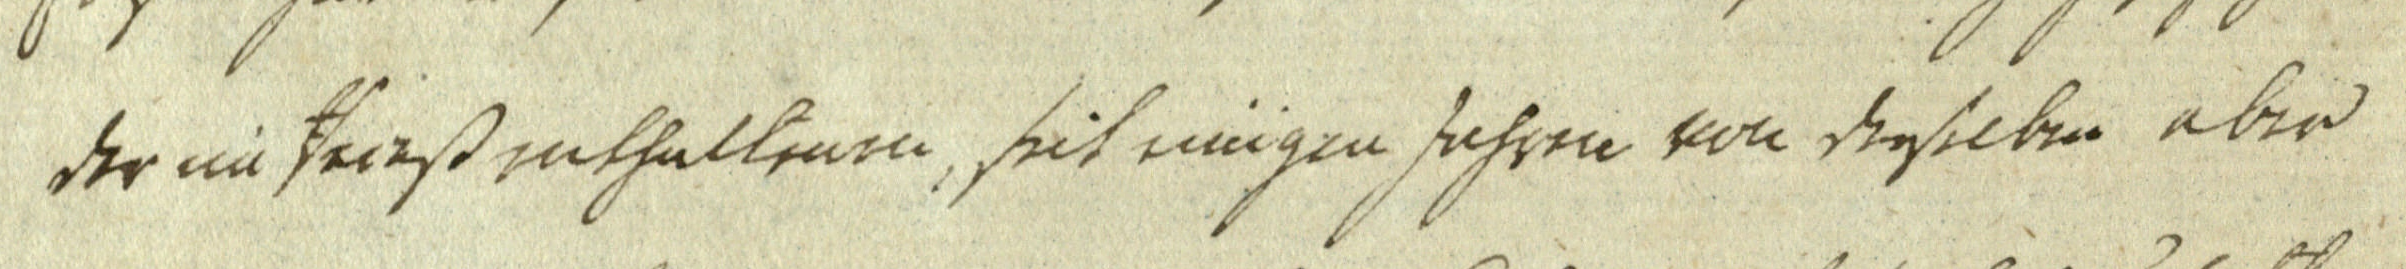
der im Receß enthaltenen, seit einigen Jahren von derselben aber
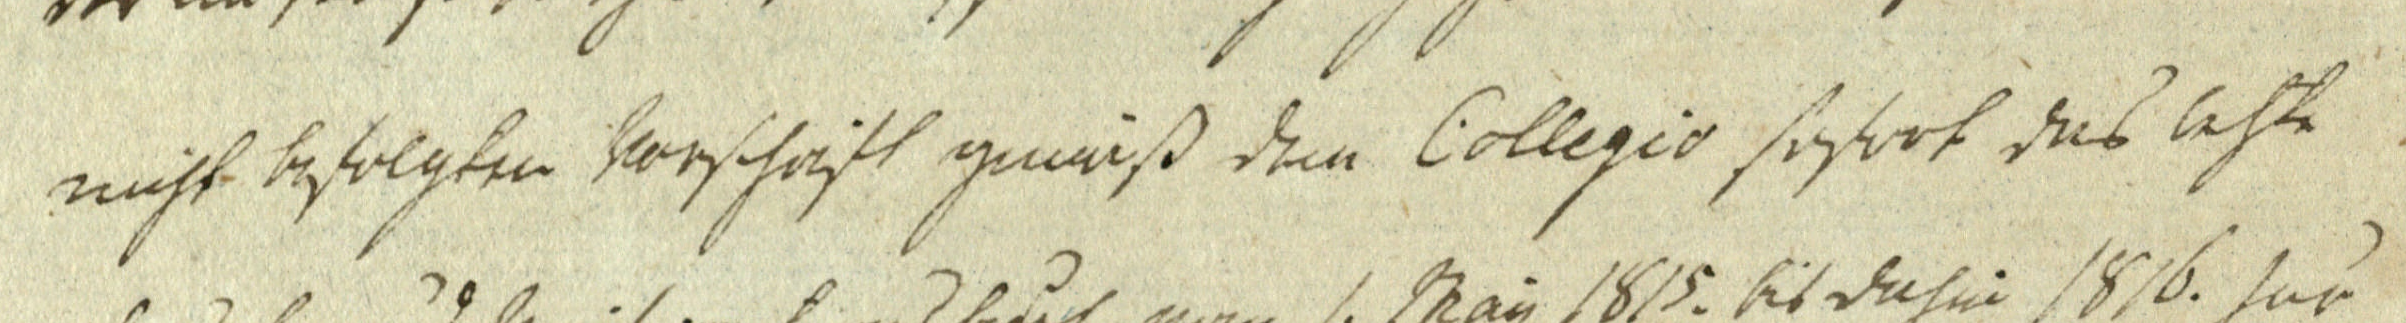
nicht befolgten Vorschrift gemäß dem Collegio sofort das letzte
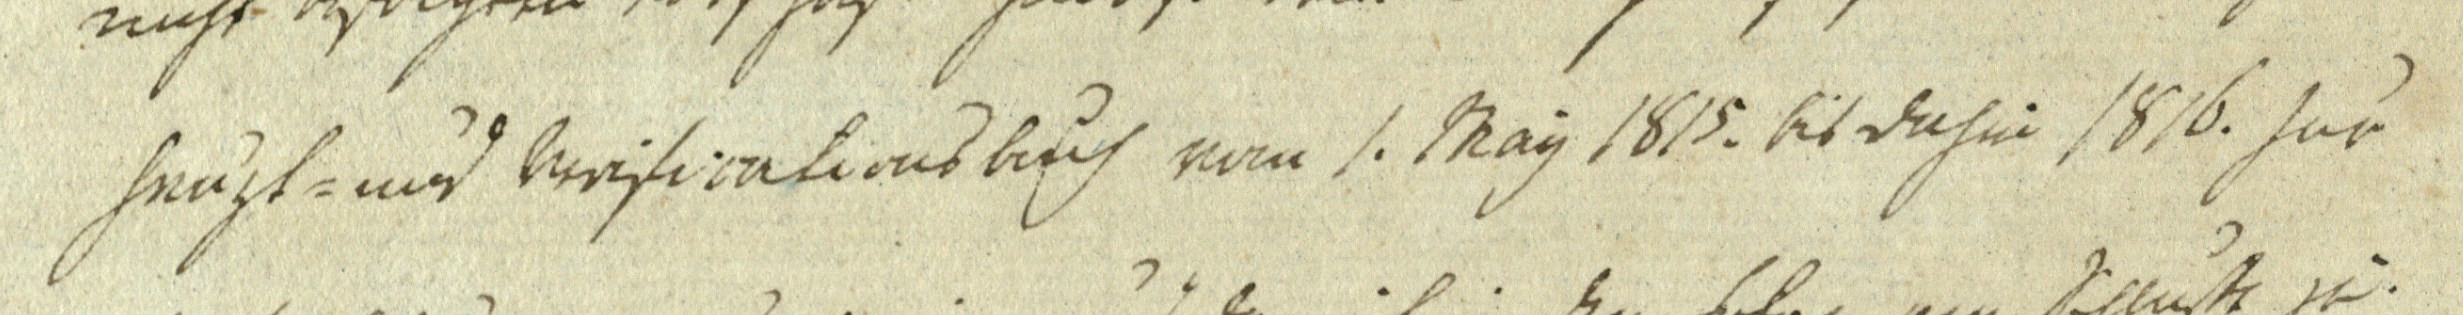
Haupt- und Verificationsbuch vom 1. Maÿ 1815. bis dahin 1816. zur
